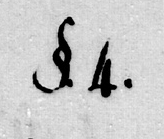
§. 4.
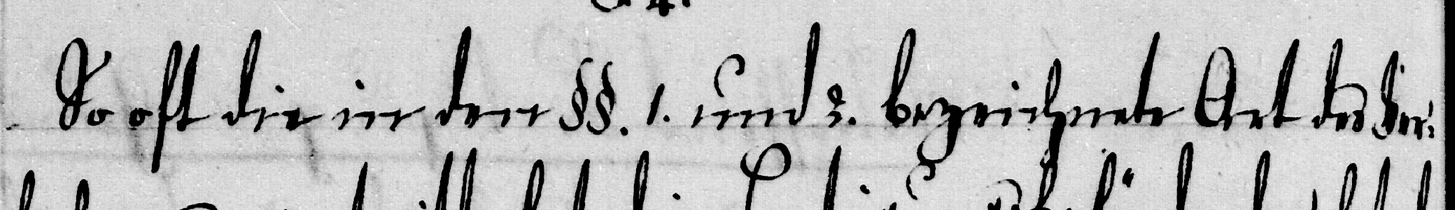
So oft die in den §§. 1. und 2. bezeichnete Art des Ve¬
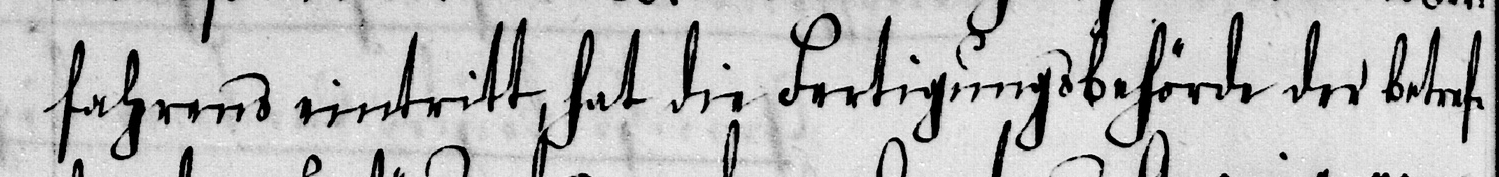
rfahrens eintritt, hat die Fertigungsbehörde der betr¬
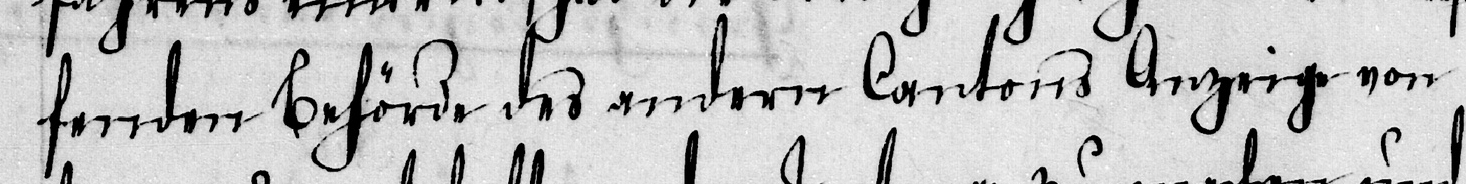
ffenden Behörde des andern Cantons Anzeige von
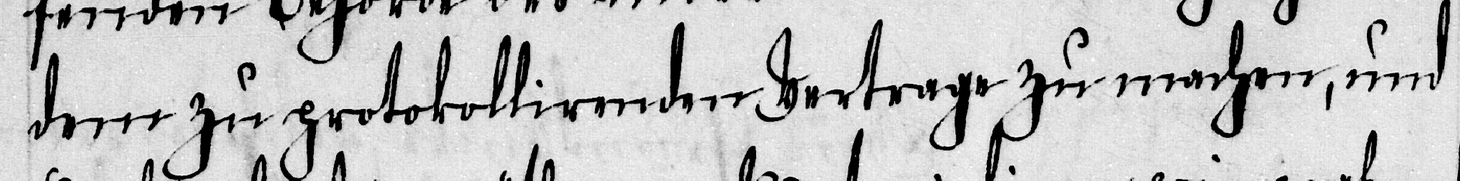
dem zu protokollirenden Vertrage zu machen, und
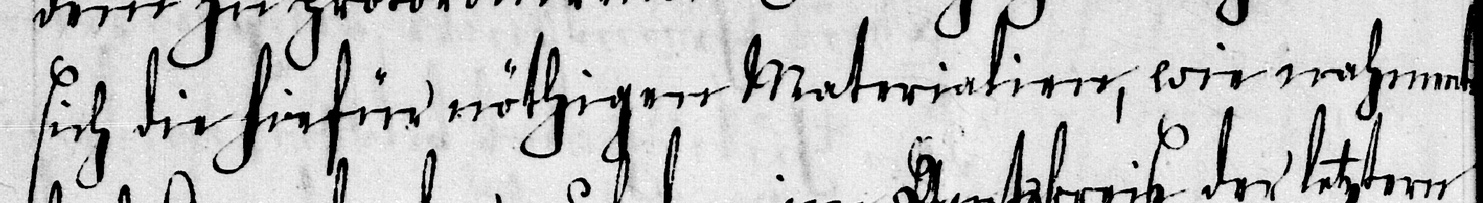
sich die hiefür nöthigen Materialien, wie nahmen¬
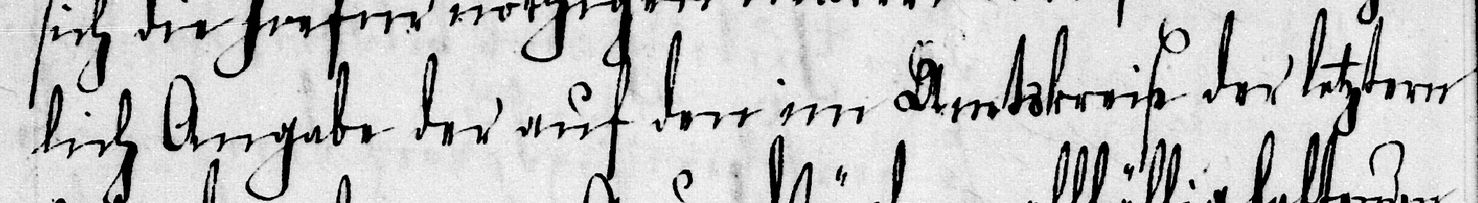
tlich Angabe der auf den im Amtskreise der letztern
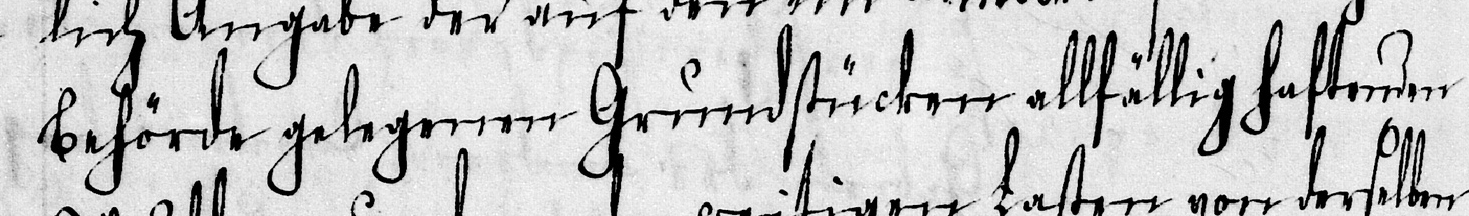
Behörde gelegenen Grundstücken allfällig haftenden
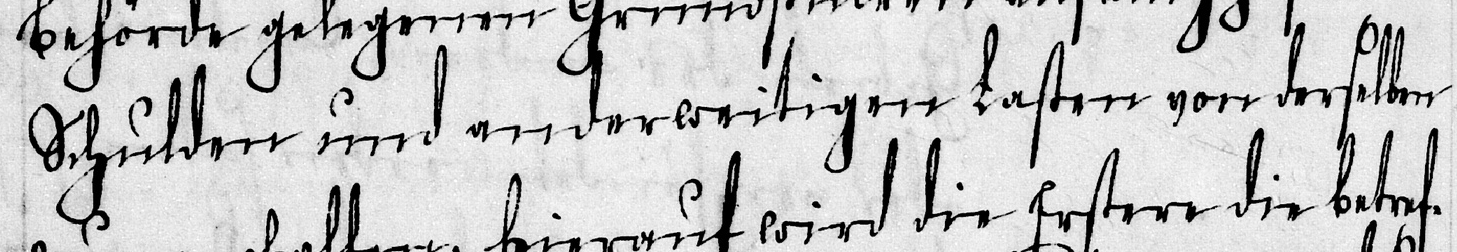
Schulden und anderweitigen Lasten von derselben
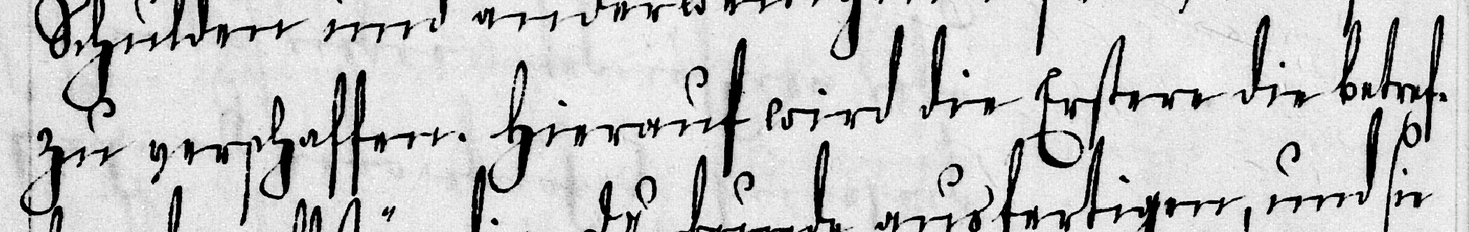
zu verschaffen. Hierauf wird die Erstere die betre¬
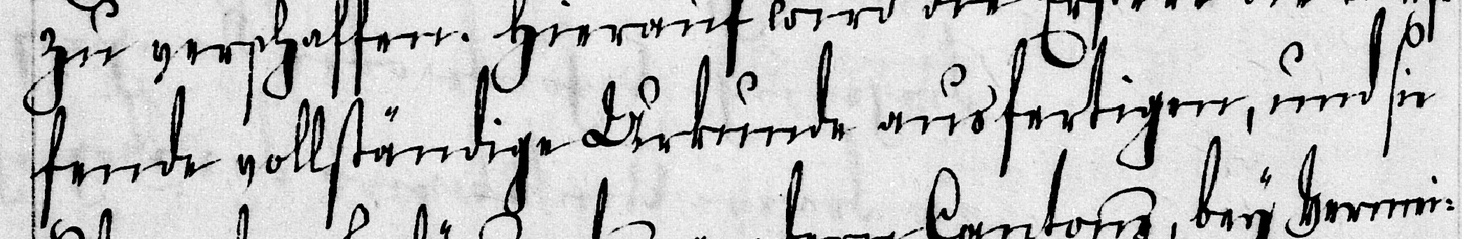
fende vollständige Urkunde ausfertigen, und sie
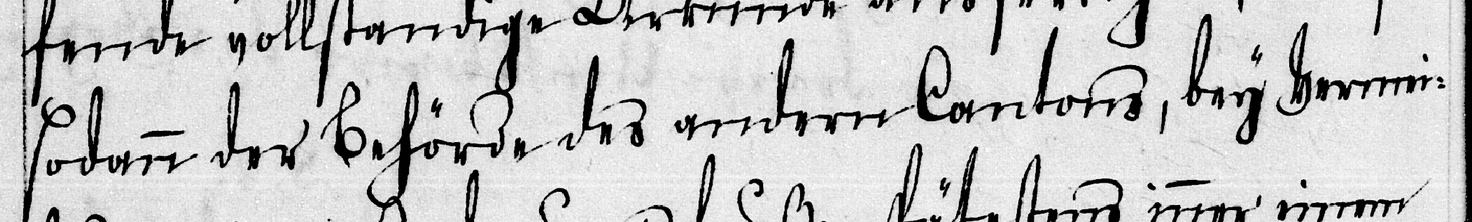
sodann der Behörde des andern Cantons, bey Vermei¬
